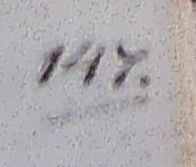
147.
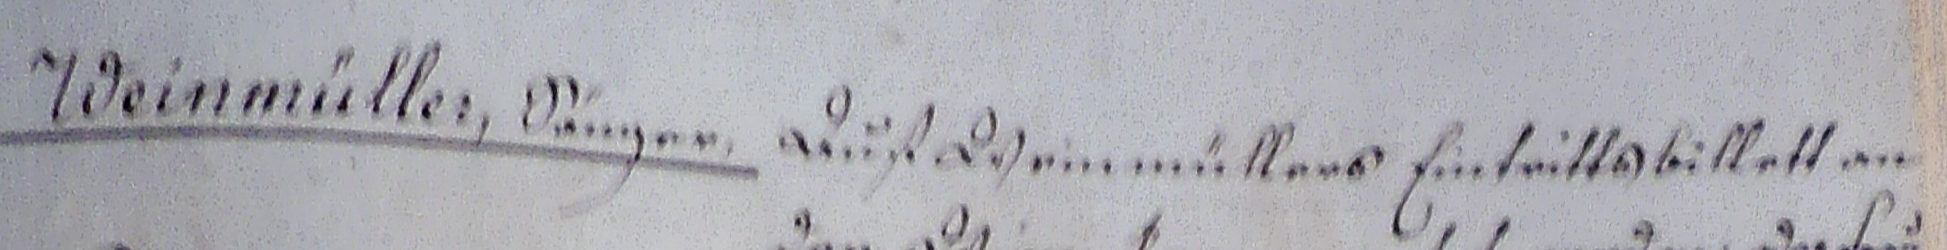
Weinmüller, Sänger Auf Weinmüllers Eintrittsbiltett an
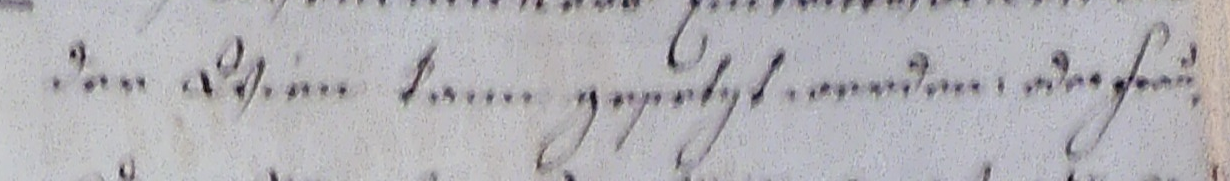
der Wien kann gesetzt werden, oder Frau.
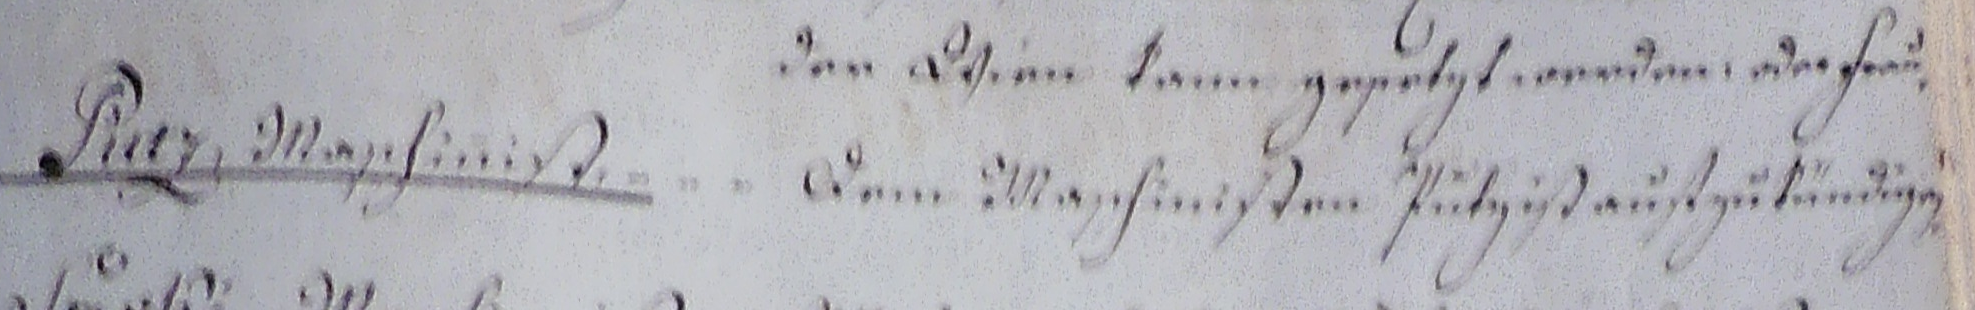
Putz, Maschinist. .. .. .. Dem Maschinisten Putz aufzukündigen.
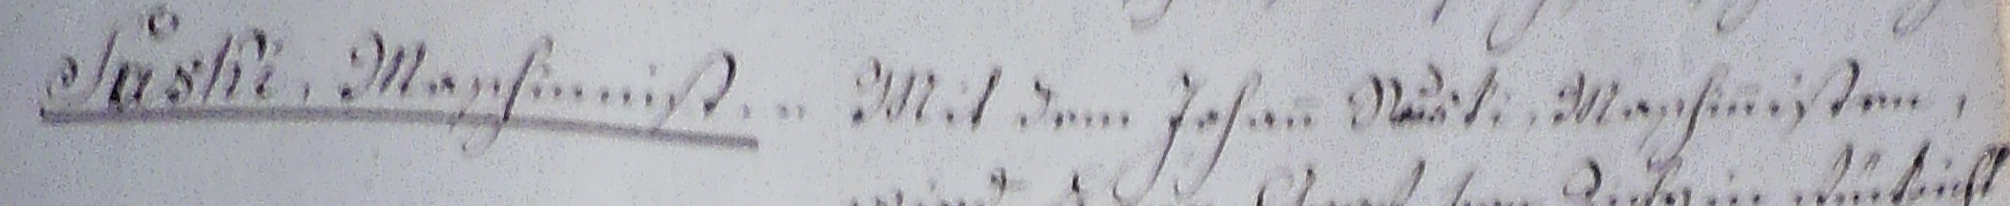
Suski, Maschinist. .. Mit dem Johan̅ Suski Maschinisten,
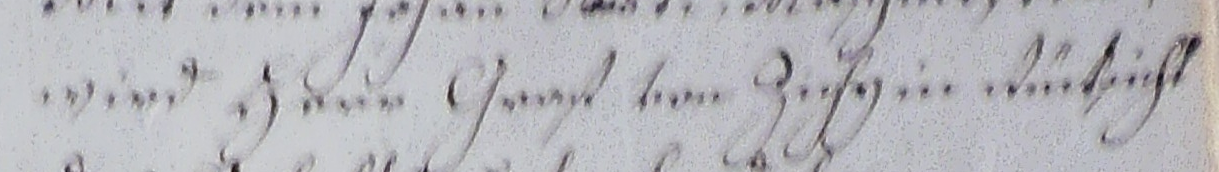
wird Herr Graf von Zichy in Rücksicht
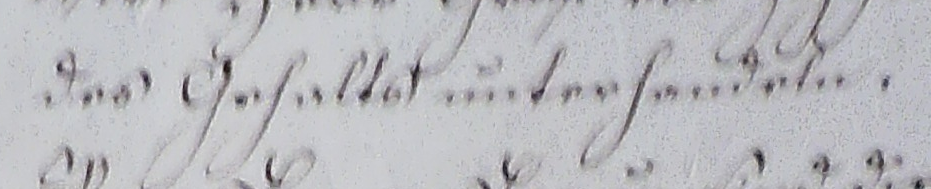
des Gehalts unterhandeln.
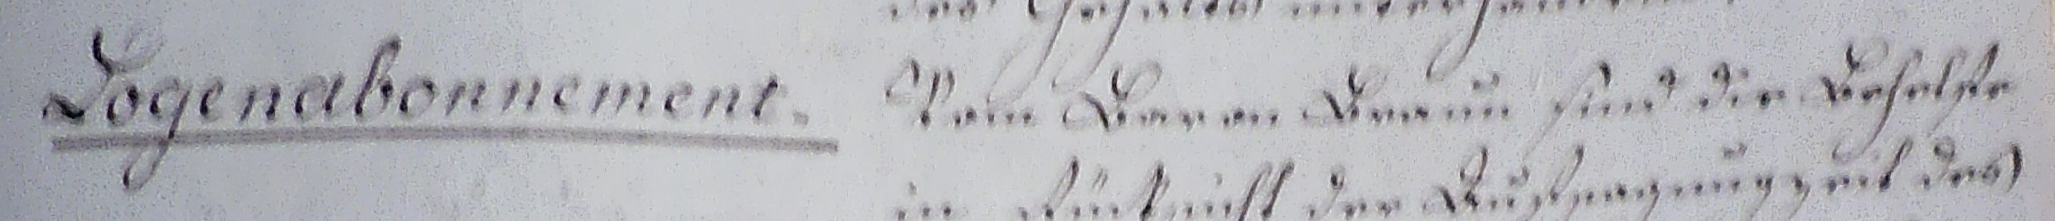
Logenabonnement. Vom Baron Braun sind die Behelfe
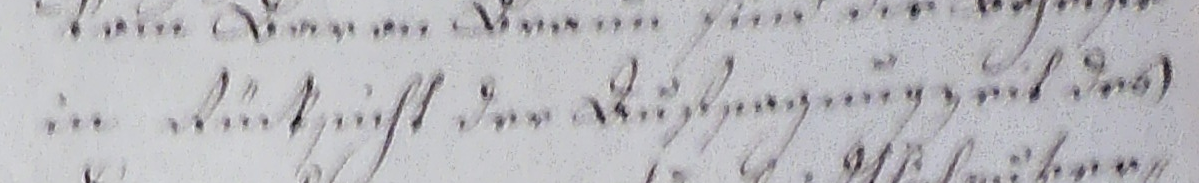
in Rücksicht der Aufsagungzeit des
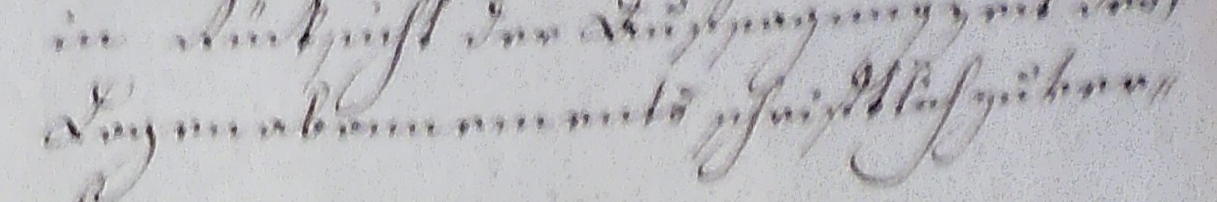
Logenabonnementä schriftlich zuver¬
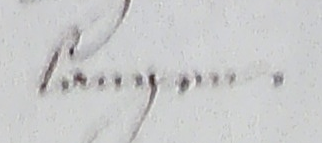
langen.
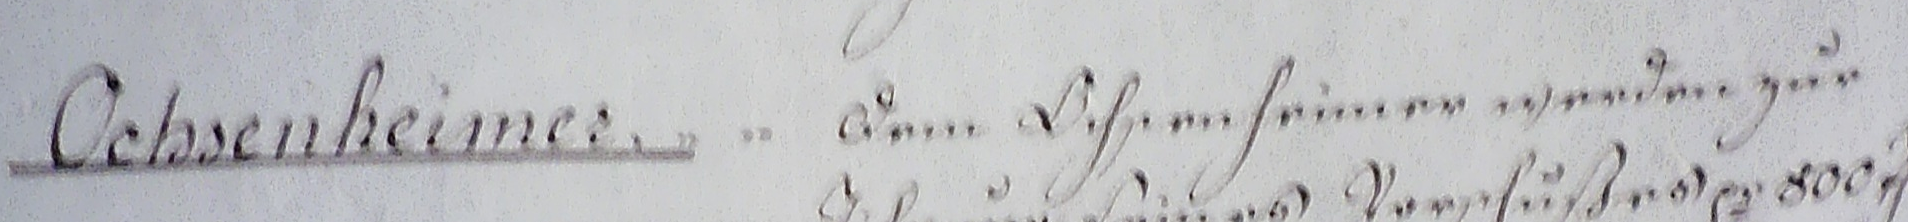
Ochsenheimer. .. .. Dem Ochsenheimer werden zur
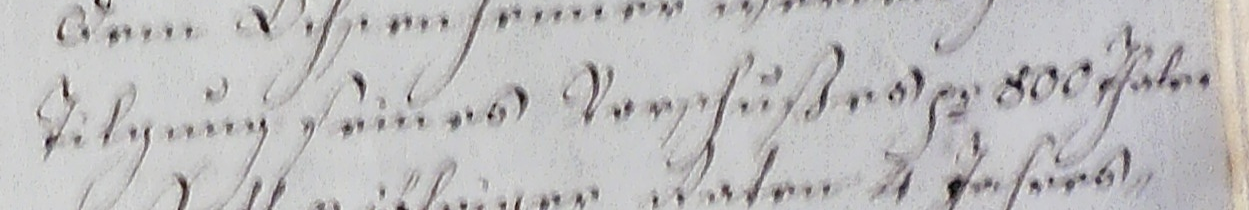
Tilgung seines Vorschußes pr͇ 800 Thaler
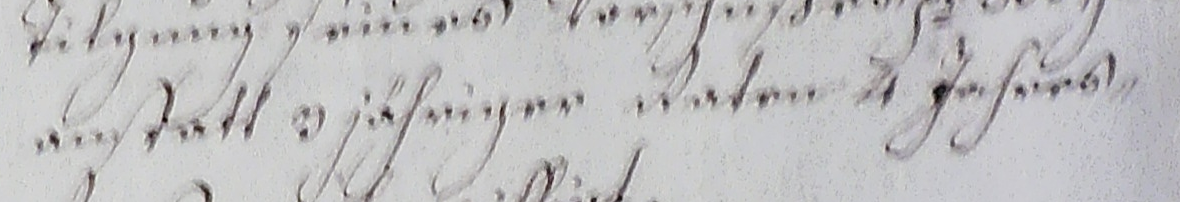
anstatt 3 jähriger Raten 4 Jahres¬
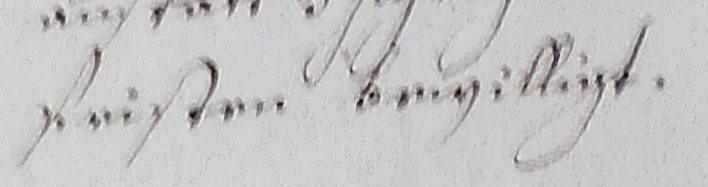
fristen bewilligt.
